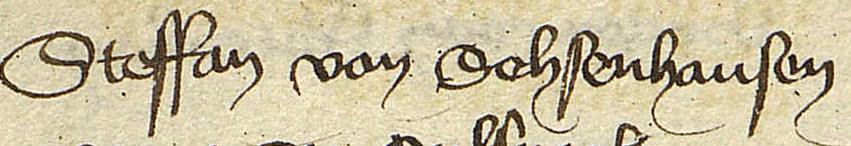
Steffan von Sehſenhauſen
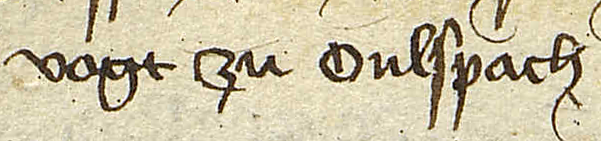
vogt cʒu Onlſpach
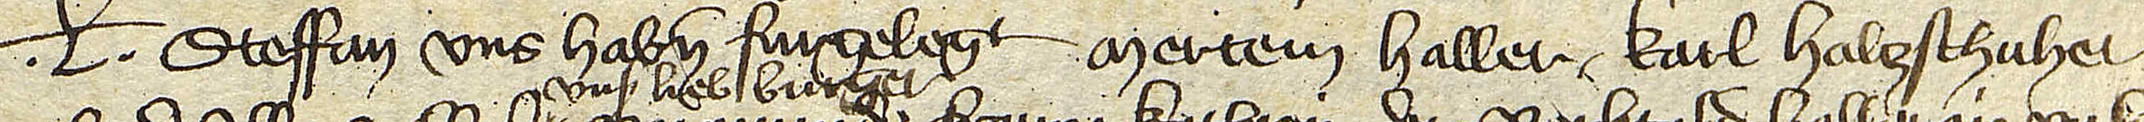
L* Steffan vns habn* fürgelegt Mertein haller / Karl holcʒſchuher
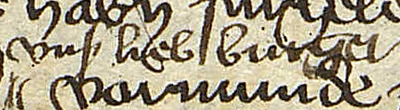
vnſ* lieb burger
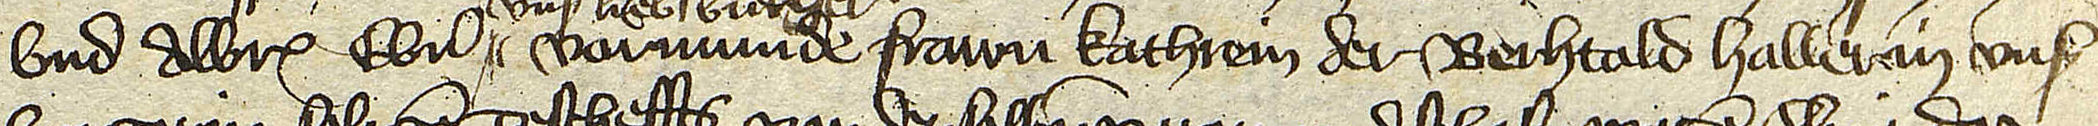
vnd Albr* Ebn* / vormunde frawn Kathrein der Berhtold hallerin vnſ*
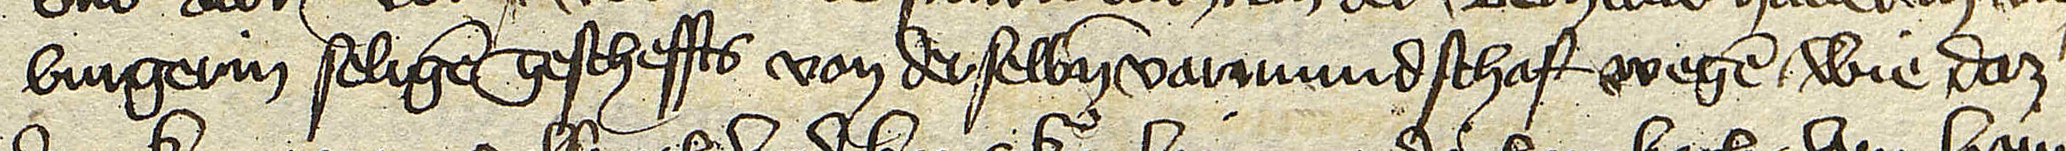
burgerin ſelige* geſcheffts von derſelbn* vormundſchaft wege* / wie daʒ
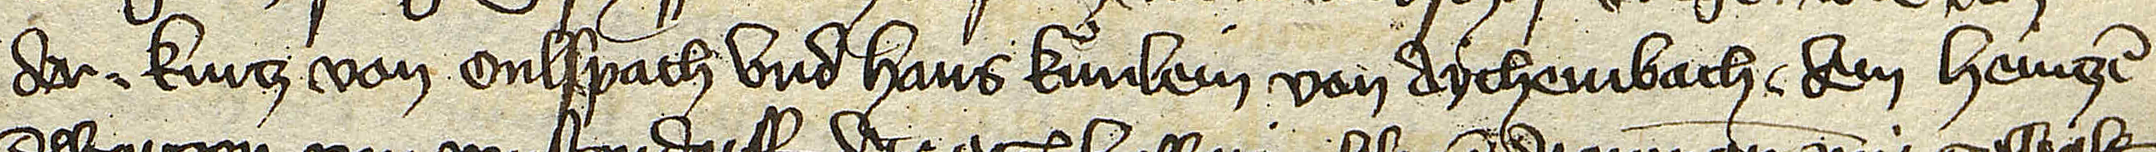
der ~ Kurcʒ von Onlſpach vnd hans Künlein von Aychembach / dem heincʒe*
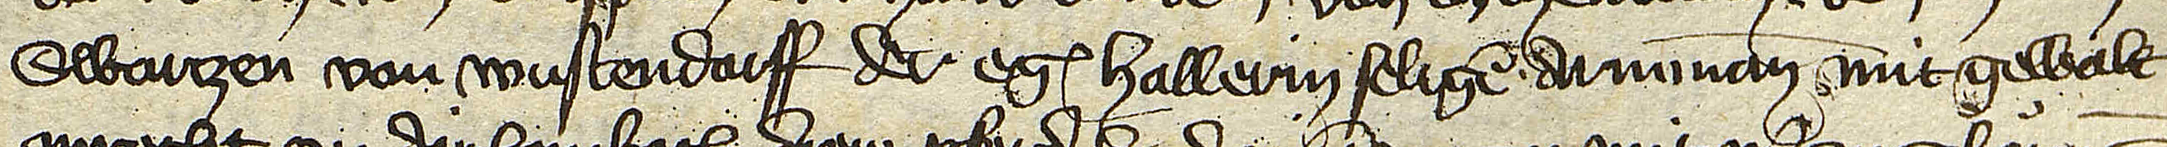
Swarcʒen von wuſtendorff der eg* hallerin ſelige* Armman* mit gewalt
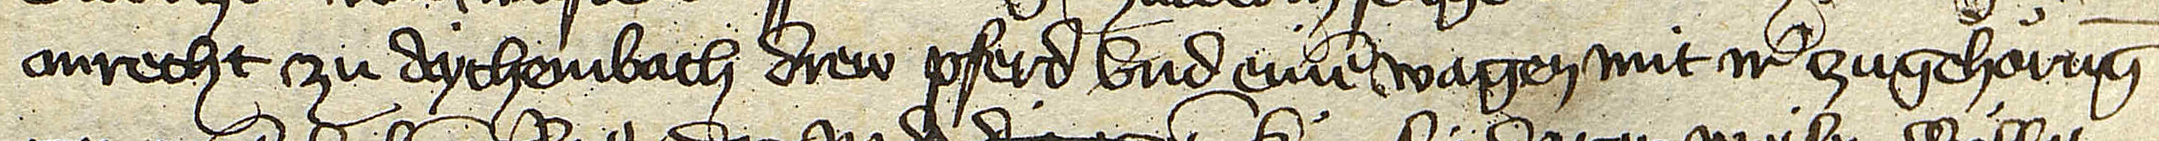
anrecht cʒu Aychembach drew pferd vnd eine* wagen mit ir cʒugehörug*
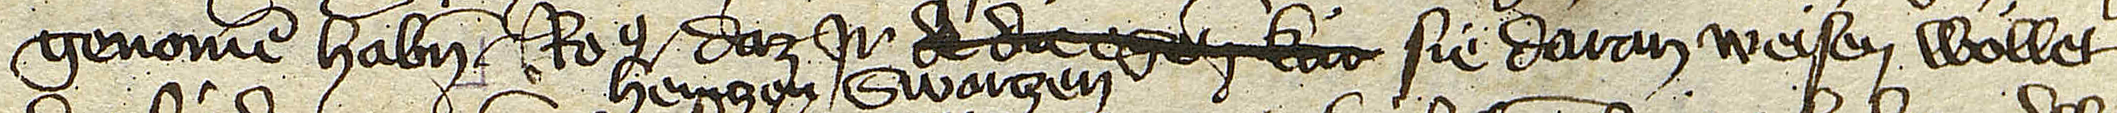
genome* habn* / Ro* / daʒ Ir de die egen* kür ſie daran weiſen wöllet
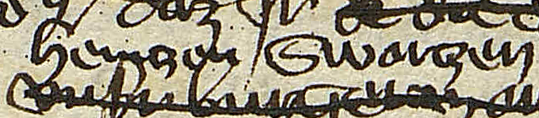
heincʒen Swarcʒen
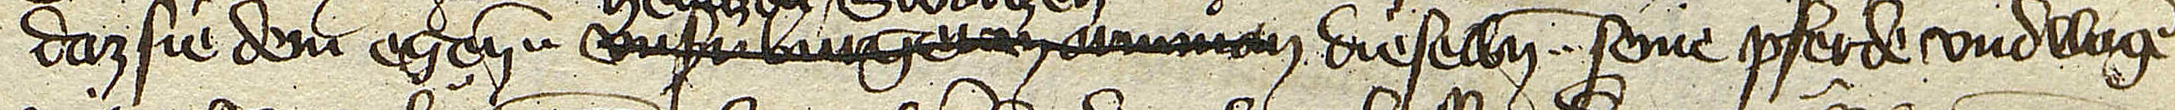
daʒ ſie dem egen* ~ vnſ*r burgerin armman dieſelbn* ~ ſeine pferde vnd wage*
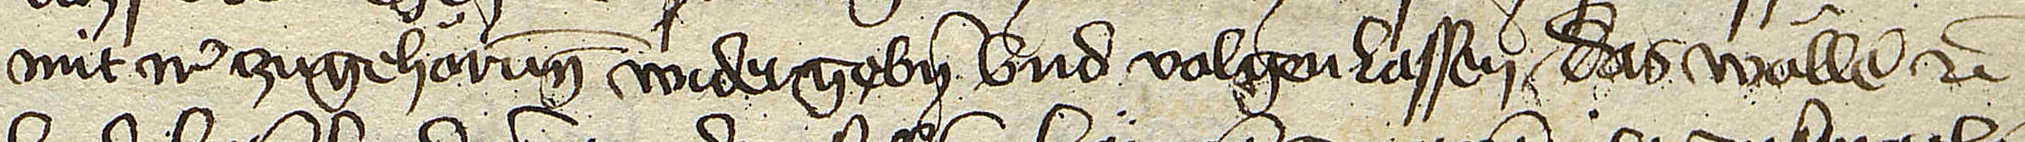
mit ir* cʒugehörug* widergebn* vnd volgen laſſen / das wölle* ec*
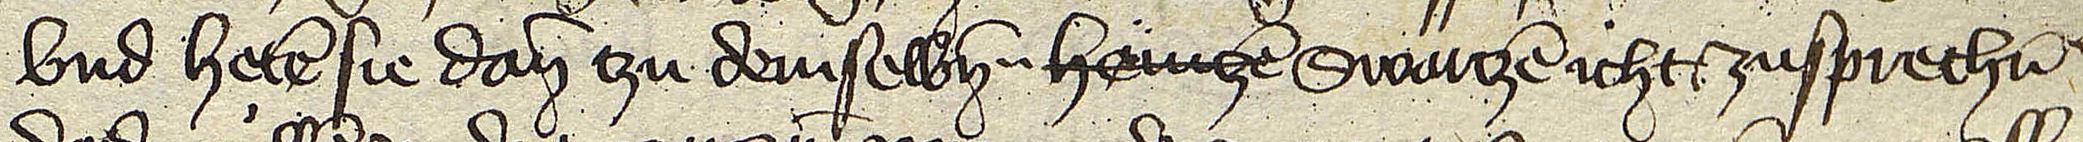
vnd hete* ſie daʒ cʒu demſelbn* ~ heincʒe* Swarcʒe* icht cʒuſprechn*
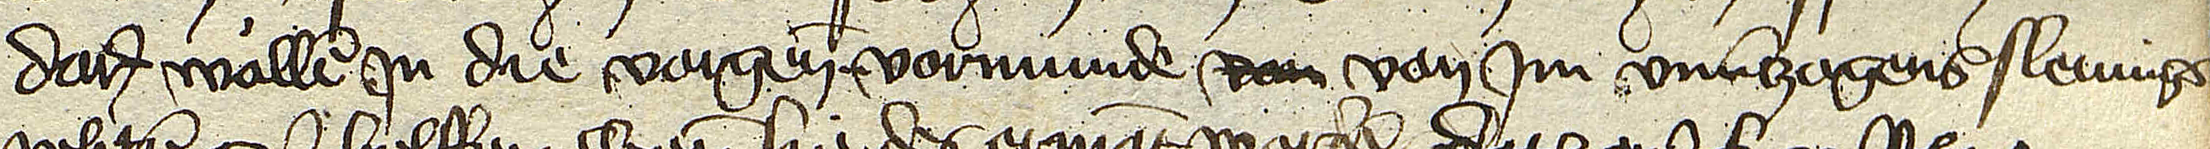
dar* wölle* In die vorgen ~ vormunde von von Im vnu*cʒogens ſlewnigs
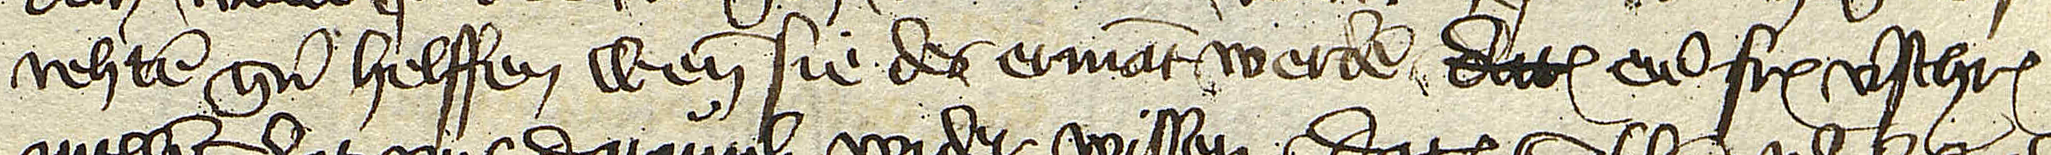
rehte* gn* helffen wen* ſie des ermat* werde* dat* ew* fr* v*ſchr*
